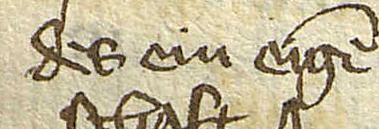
des ein eige*
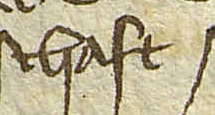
ſchaft
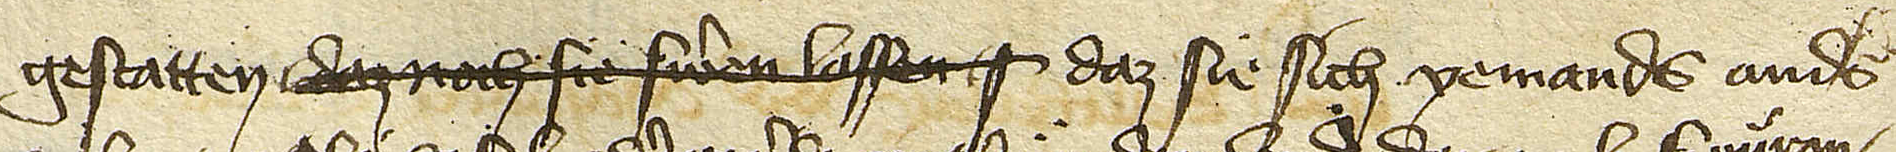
geſtatten / daʒ noch ſie ſw*en laſſen / ſ daʒ ſie ſich yemands ands*
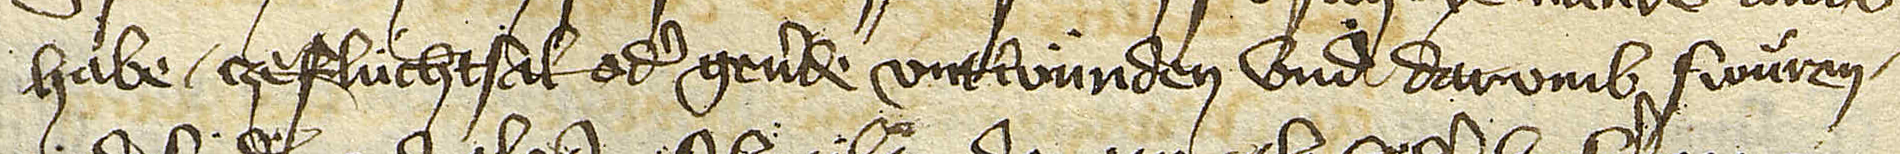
habe / cʒeflüchtſal od* gen*de vnt*wünden vnd darvmb ſwüren /
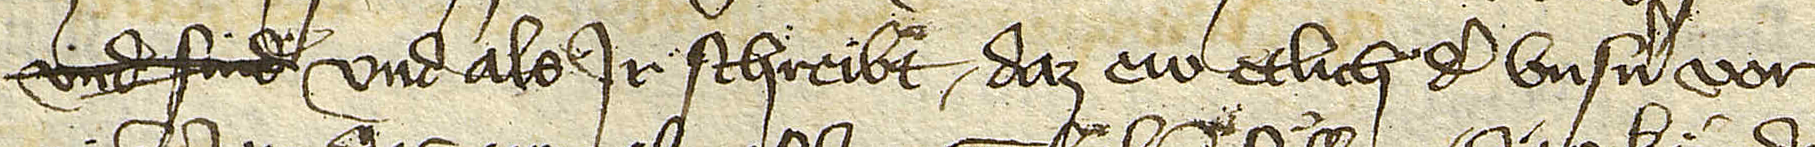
vnd ſind vnd als Ir ſchreibt / daʒ ew etlich d* vnſn* vor
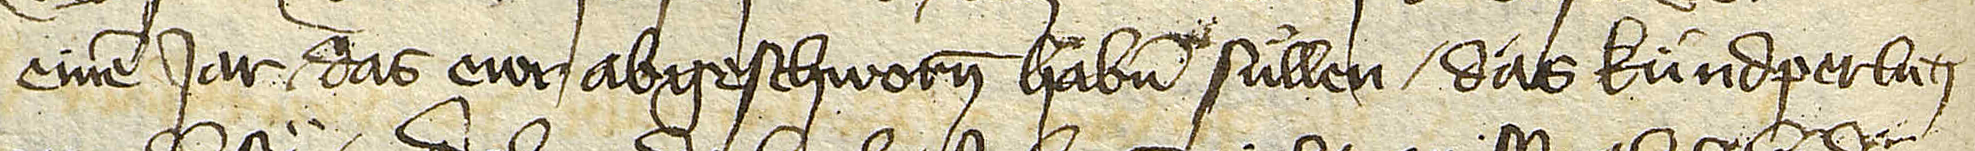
eine* Iar / das ewr abgeſchworn habn* ſüllen / das kündperln /
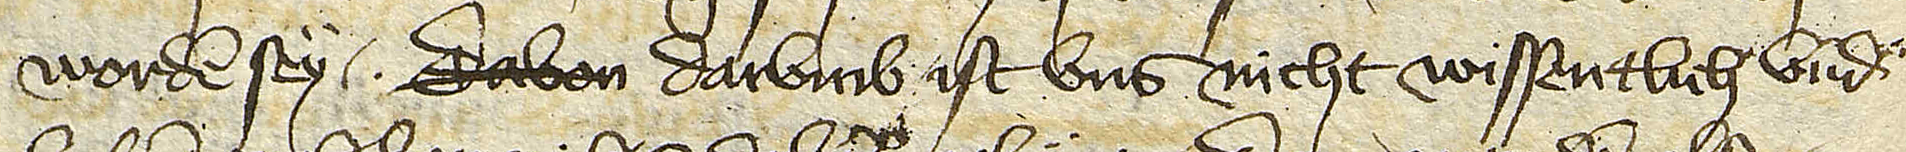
worde* ſey / . Davon darvmb iſt vns nicht wiſſentlich vnd
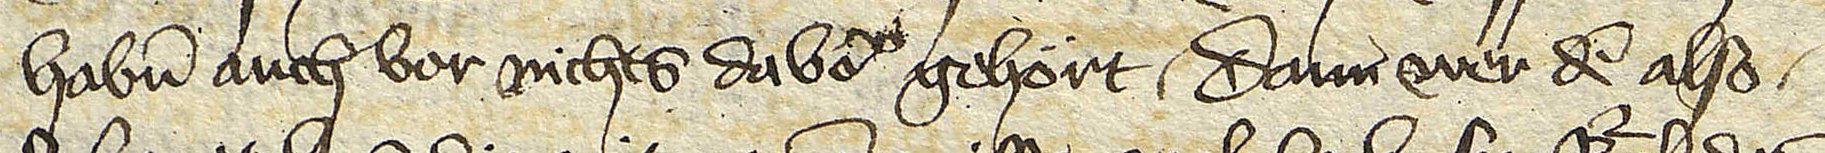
habn* auch vor nichts davo* gehört / Dann wer d* alſo /
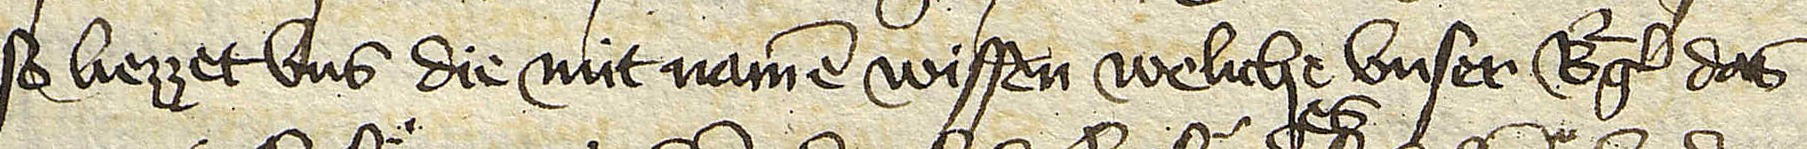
ſo lieʒʒet vns die mit name* wiſſen weliche vnſer B*g* das
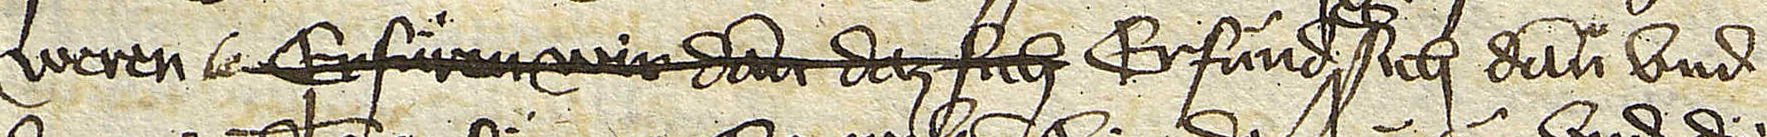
weren / Erfüren wir dan* daʒ ſich Erfünd ſich dan* vnd
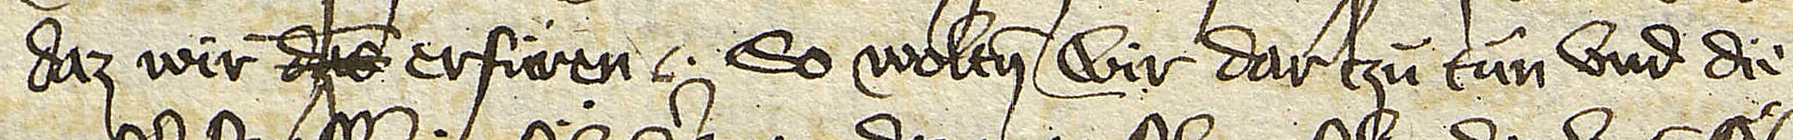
daʒ wir das erfüren / . So woltn* wir darcʒü tün vnd die
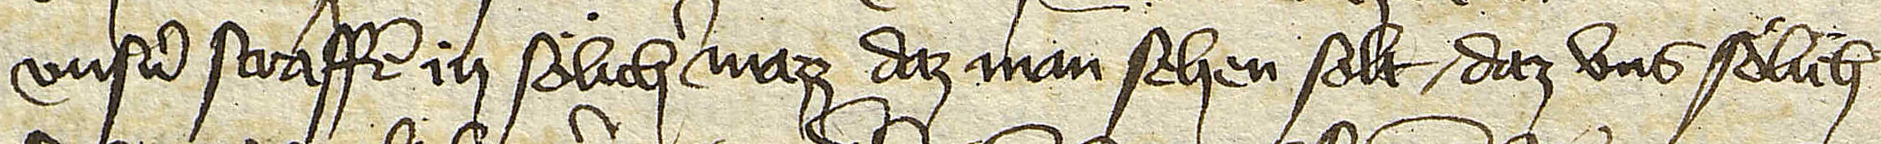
vnſn* ſtraffe* in ſölich maʒʒ daʒ man ſehen ſolt / daʒ vnd ſölich
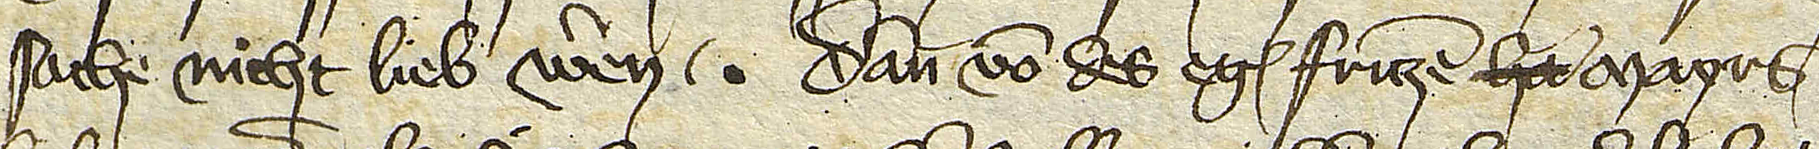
ſache nicht lieb wen* / . Dan* vo* des eg* fricʒe* ha Mayrs
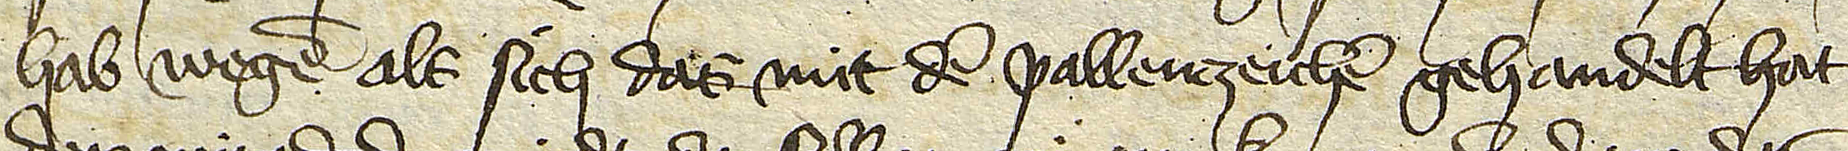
hab wege* als ſich das mit d* pallencʒeiche* gehandelt hat
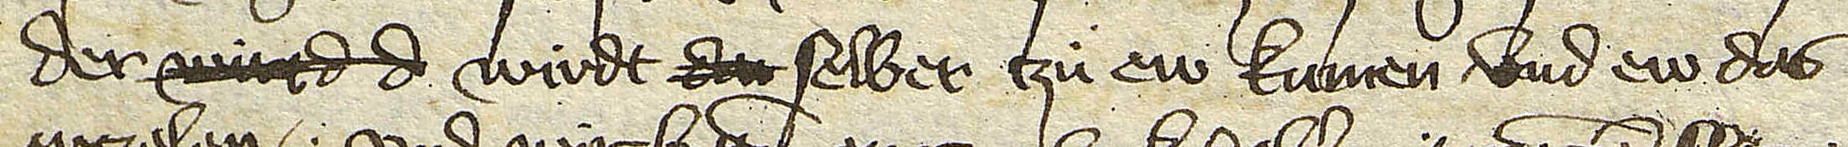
der wirt d d wirdt da ſelber cʒü ew kumen vnd ew das
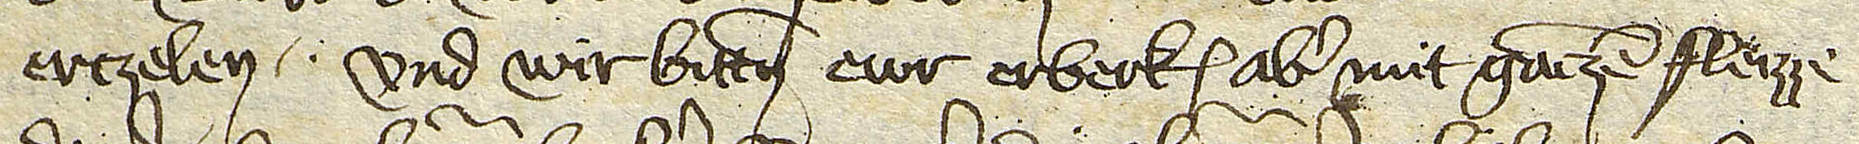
ercʒelen / . vnd wir bittn* ewr erberk* ab* mit gacʒe* fleiʒʒe
